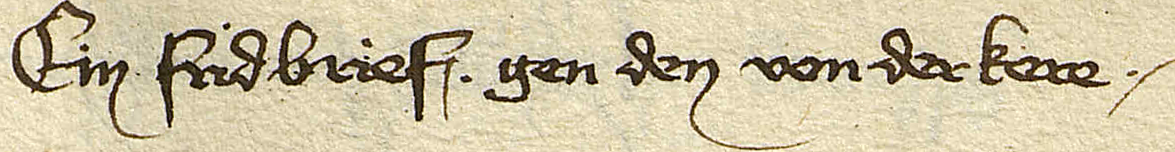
Ein frid brief . gen den von der kere . /
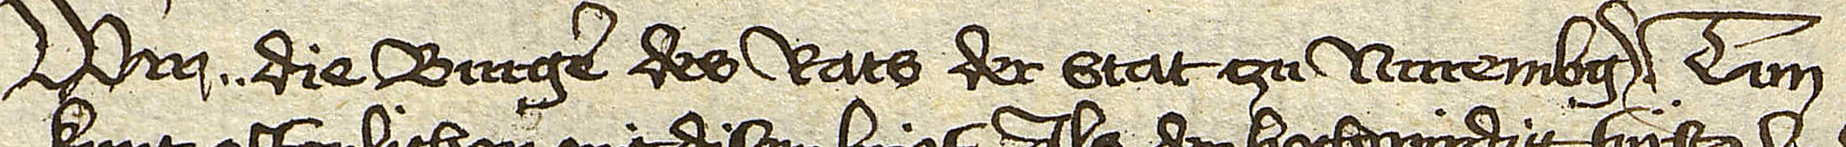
Wir ~ die Burge* des Rats der Stat cʒu Nurembg* / Tun
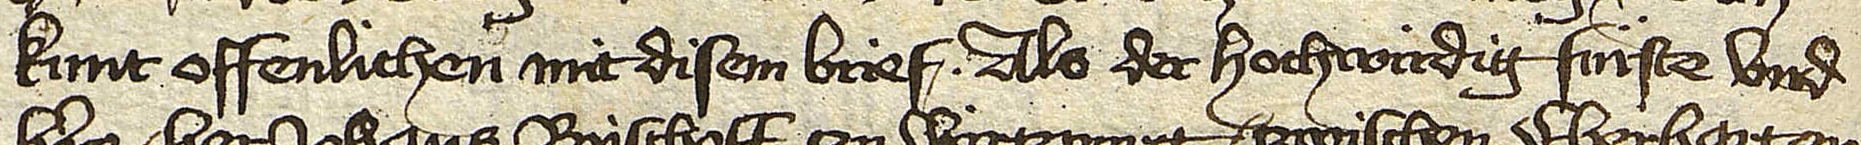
kunt offenlichen mit diſem brief . Alſo der hochwirdig fürſte vnd
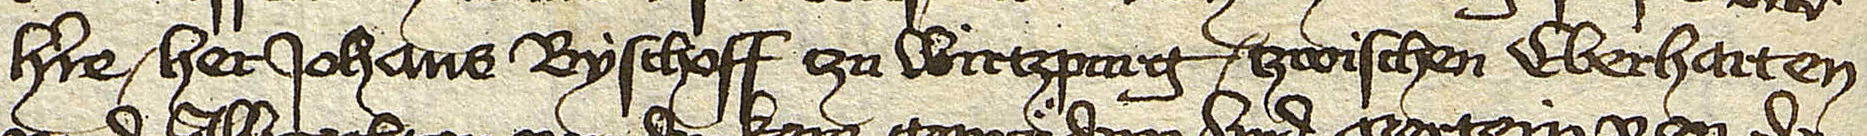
h*re / her Iohans Byſchoff cʒu Wircʒpurg / cʒwiſchen Eberharten
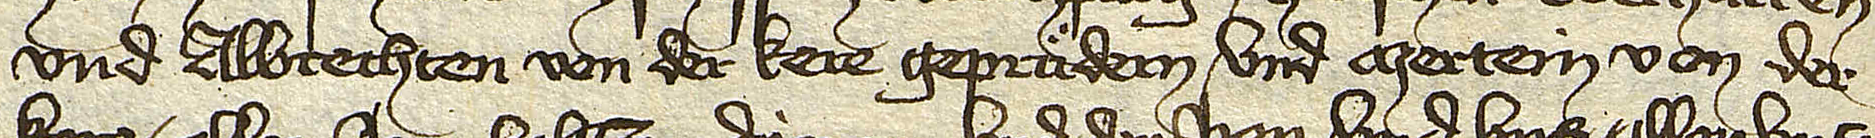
vnd Albrechten von der kere geprüdern / vnd Mertein von der
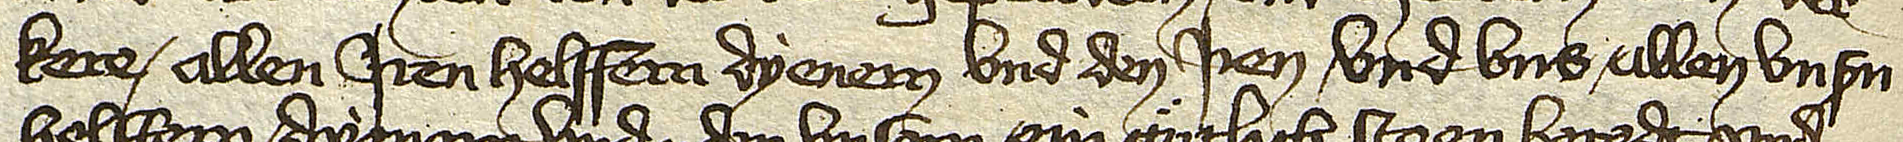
kere / allen Iren helffern dyenern vnd den Iren / vnd vns / allen vnſ*n
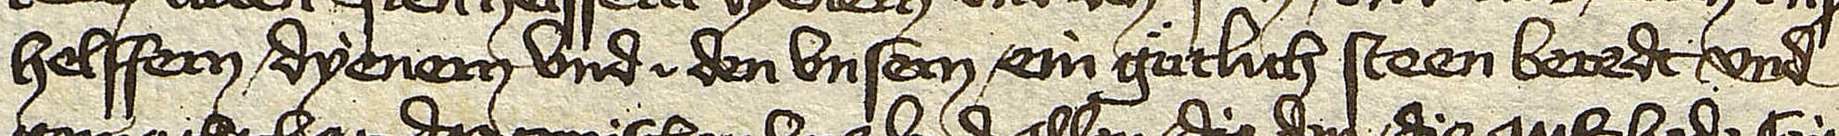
helffern / dyenern vnd ~ den vnſern / ein gütlich ſteen beredt vnd
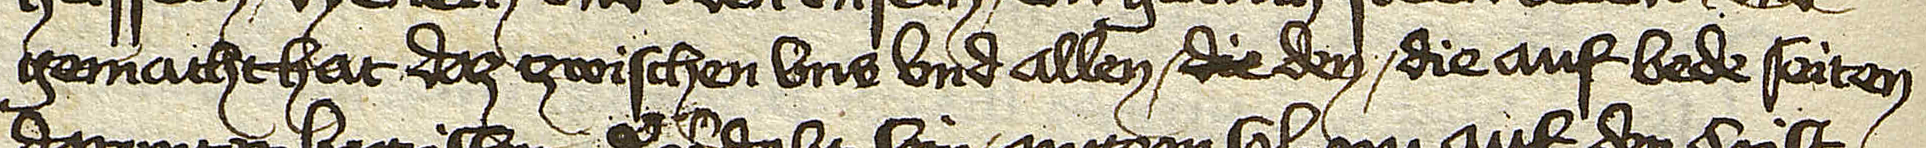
gemacht hat daʒ cʒwiſchen vns vnd allen / die den / die auf bede ſeiten
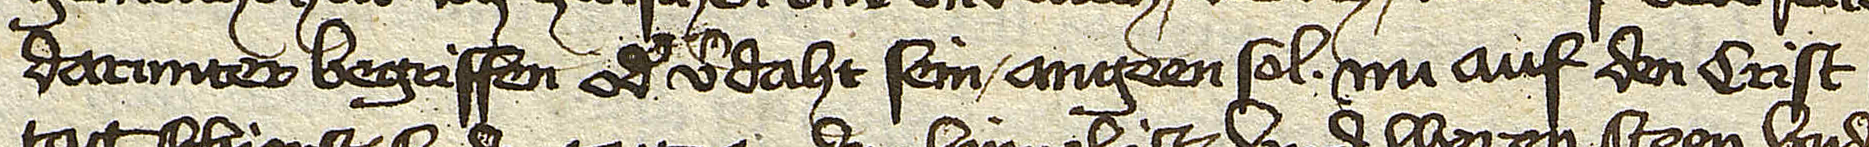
darunter begriffen od* v*daht ſein / angeen ſol . nu auf den Criſt
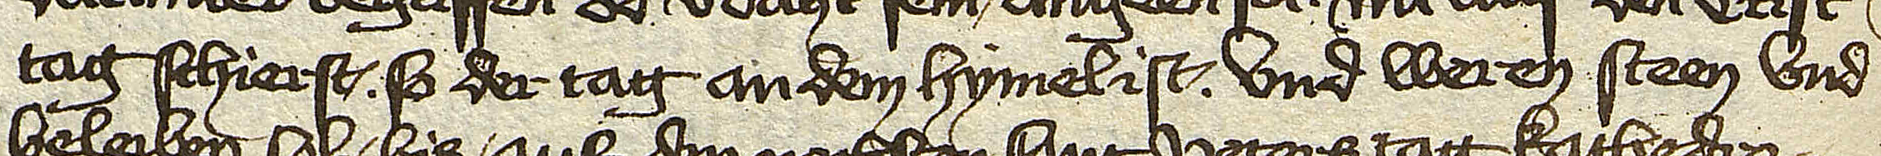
tag ſchierſt / . ſo der tag an dem hymel iſt . vnd weren ſteen vnd
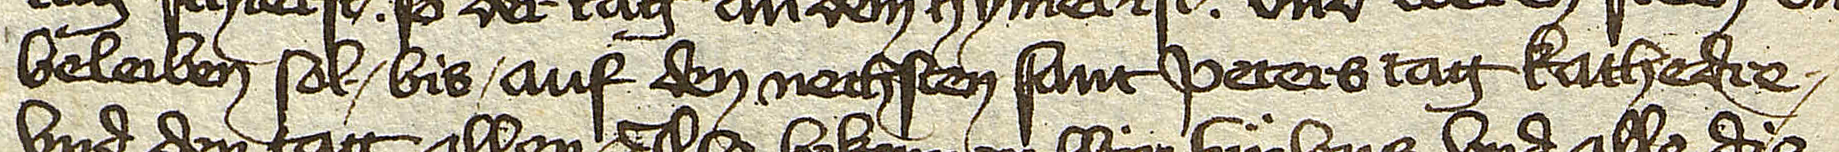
beleiben ſol / bis / auf den nechſten ſant Peters tag kathedre /
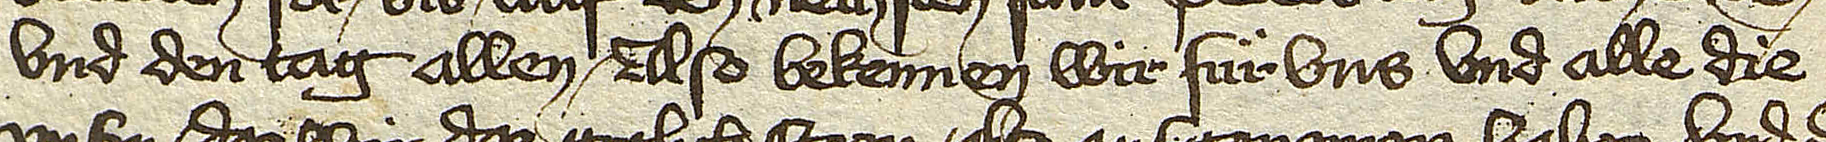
vnd den tag allen / Alſo bekennen wir für vns vnd alle die
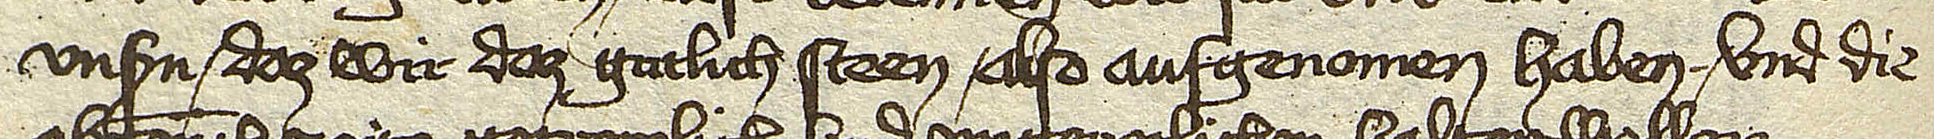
vnſ*n / daʒ wir daʒ gutlich ſteen / alſo aufgenomen haben . / vnd die
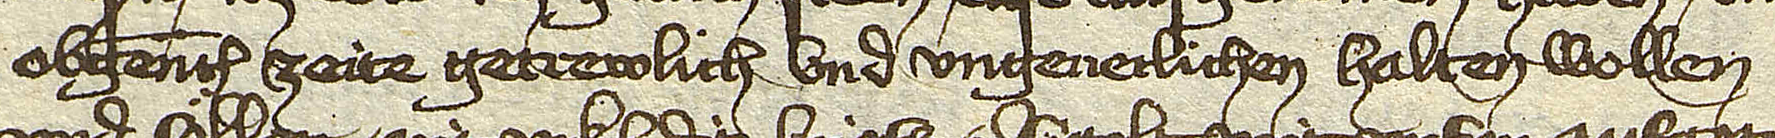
obgent* cʒeite getrewlilch vnd vngeuerlichen halten wollen
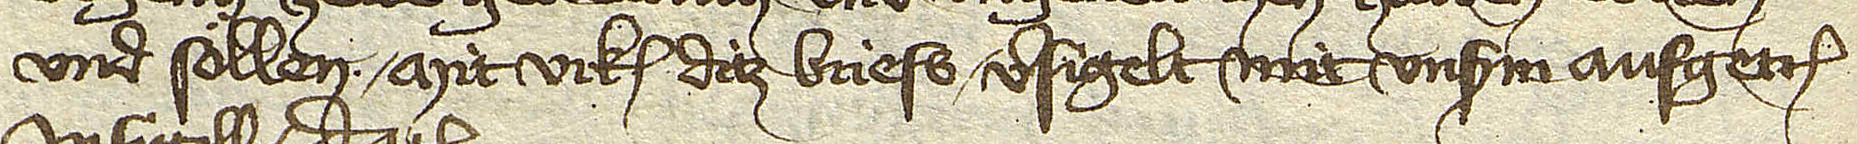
vnd ſöllen . / Mit vrk* dicʒ briefs / v*ſigelt mit vnſ*m aufgetr*
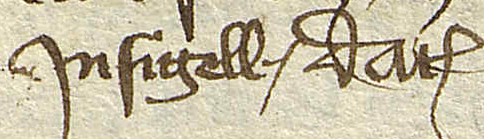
Inſigell / dat*
